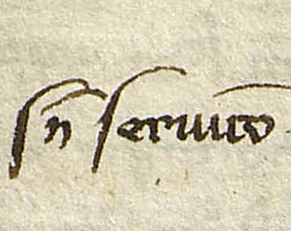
ſ*n ſerui*co
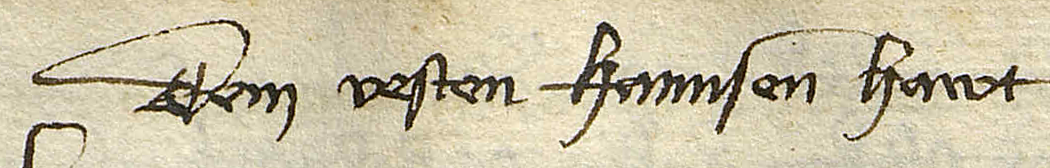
Dem veſten Hannſen hawt
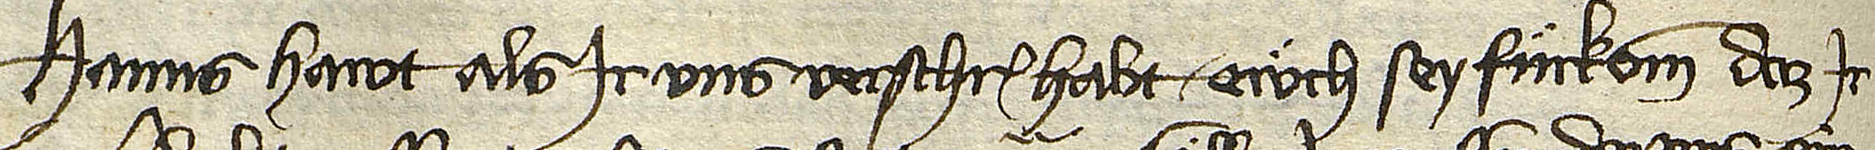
Hanns hawt als Ir vns verſchr* habt / eẅch ſey fürkom* daʒ Ir
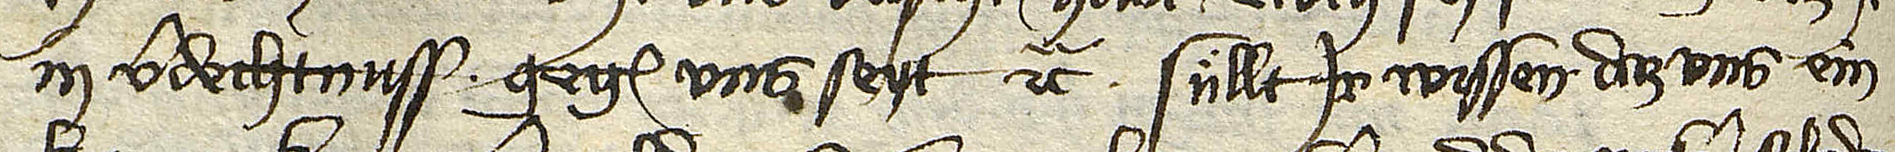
in v*dechtnuſſ . geg* vns ſeyt ec* . ſüllt Ir wiſſen daʒ vns ein
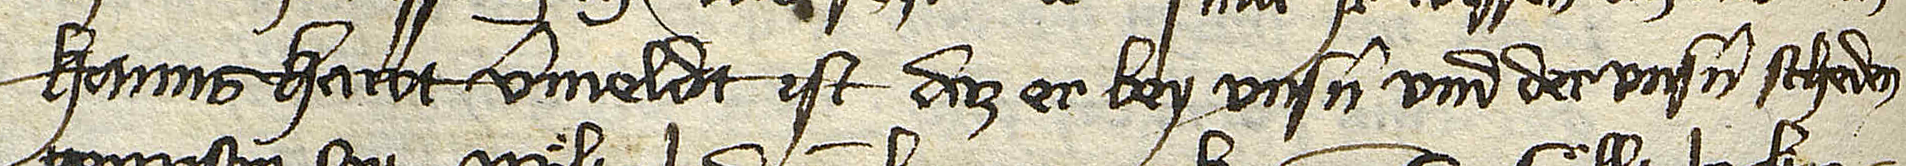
Hanns Hawt v*meldt iſt daʒ er bey vnſ*n vnd der vnſ*n ſcheden
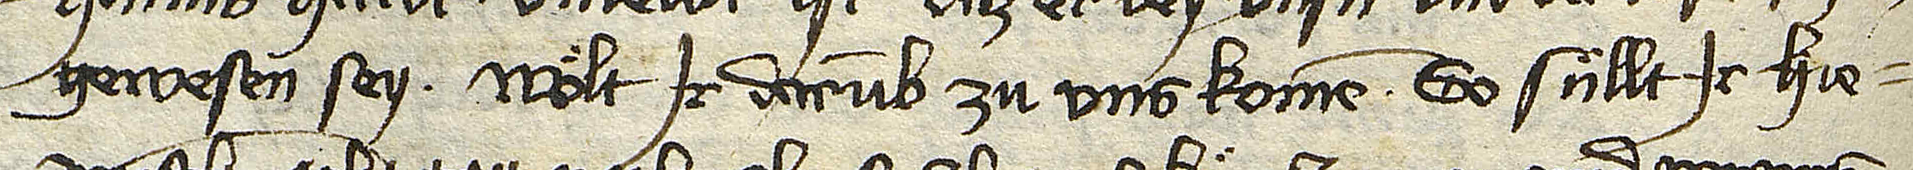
geweſen ſey . Wölt Ir darüb* ʒu vns kome* . So ſüllt Ir hie =
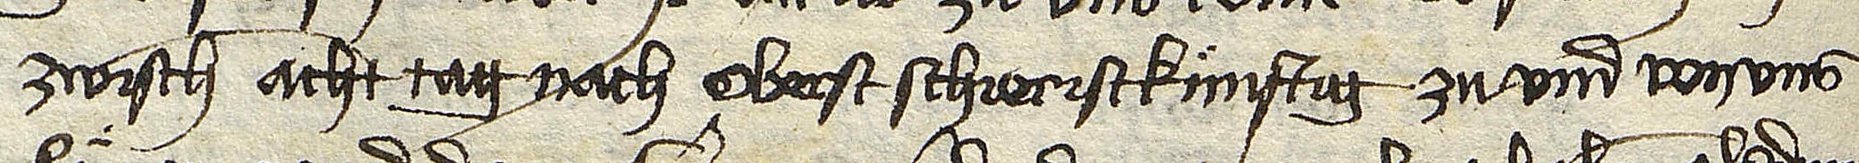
ʒwiſch* acht tag nach Oberſt ſchieriſtkünſtig ʒu vnd von vns
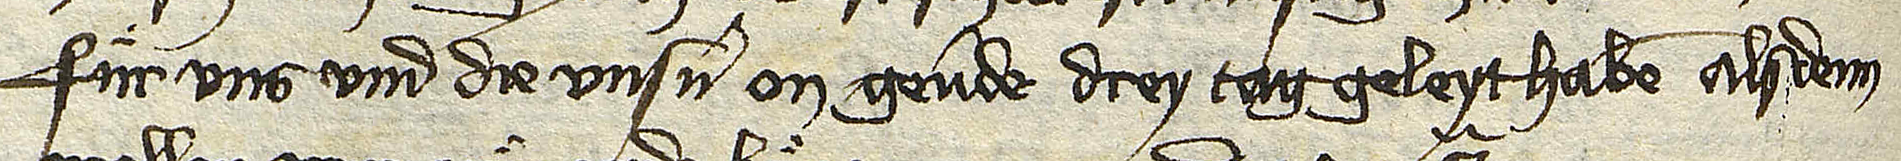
für vns vnd die vnſ*n on geu*de drey tag geleyt habe* alſdenn
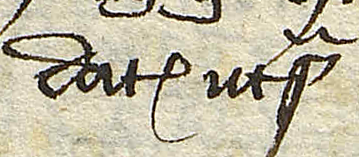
Dat* ut ſ*
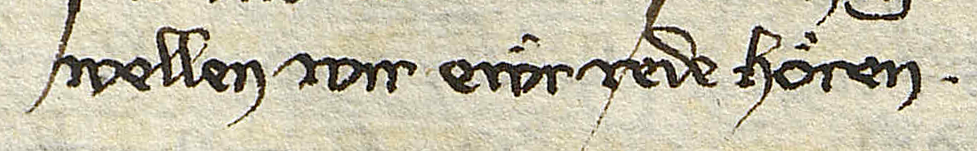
wellen wir eẅr rede hören .
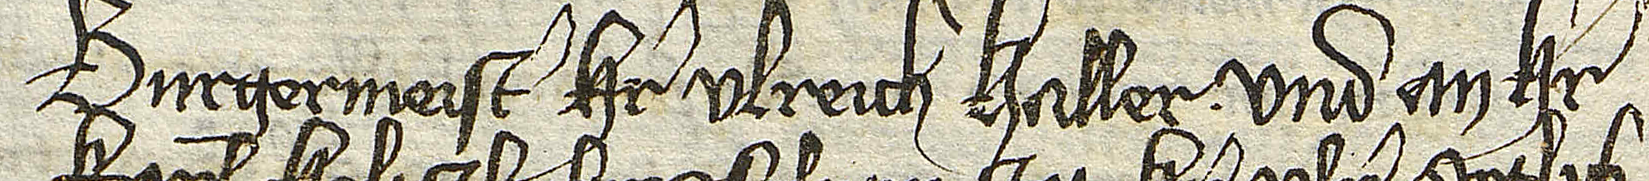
Burgermeiſt* H*r vlreich Haller . Vnd an h*r
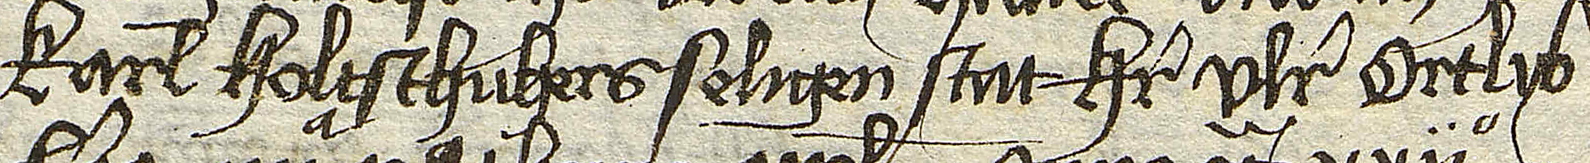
Karls Holtſchuhers ſeligen ſtat h*r vlr* Ortlyb
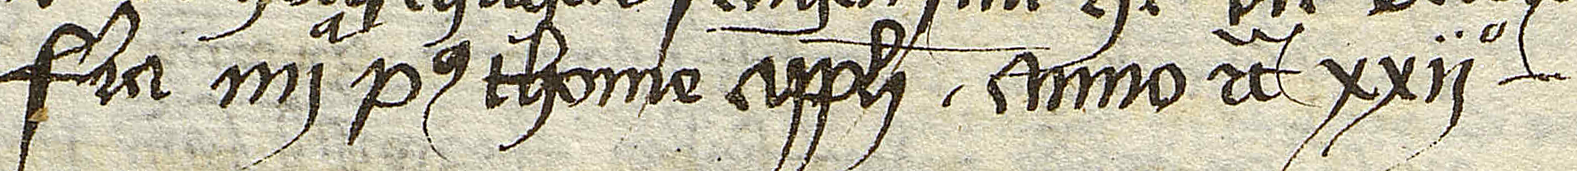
f*ia iiii* p* thome appl* . Anno ec* xxii* -
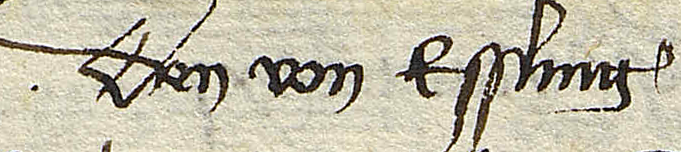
Den von Eſſling*
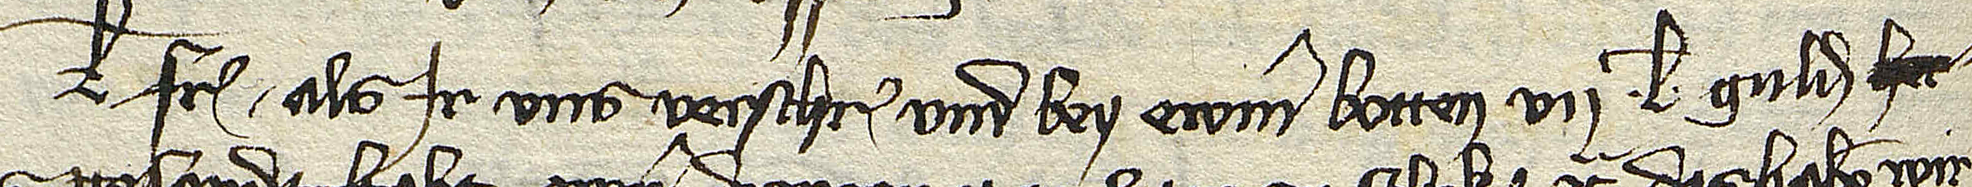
L* fr* / als Ir vns verſchr* vnd bey ewm* botten vii* l* guld* her=
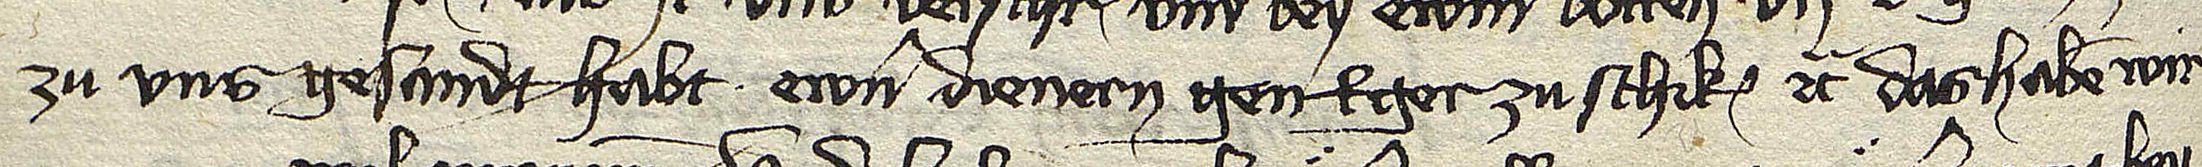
ʒu vns geſandt habt . ewn* dienern gen Eger ʒu ſchik* ec* das habe* wir
